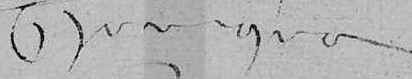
bramqua
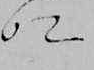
62
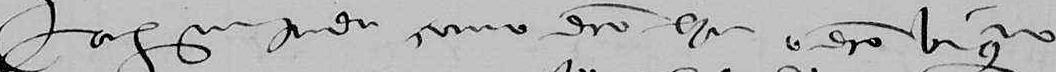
E aꝑsentada como dīo he o dīo vigro
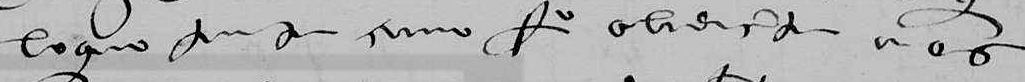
loguo tente como fo obediēte aos
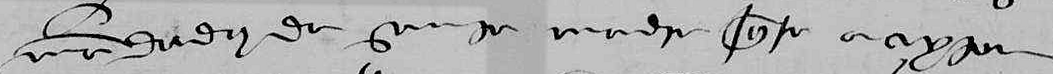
mādadꝯ da santa madre Jḡja aceytou
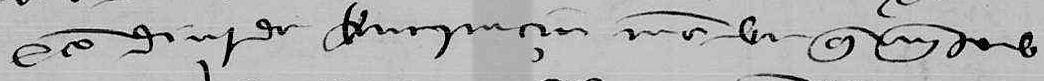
e c̄o diujda Reuerencia mādou q̄ em todo
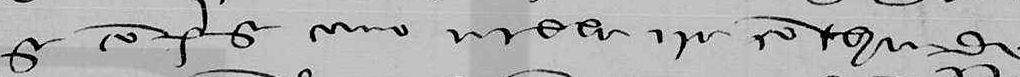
se c̄op̄ise como nella era c̄otheudo
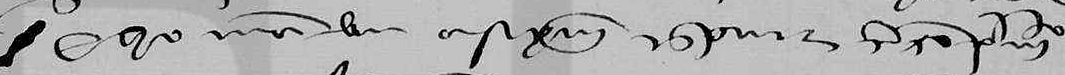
e ho mādou asym espuer ē c̄op̄imto
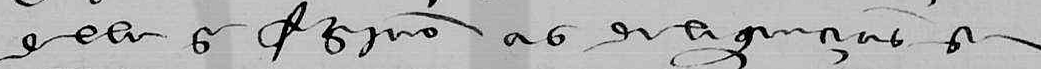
della se fezeraõ as deligencias se
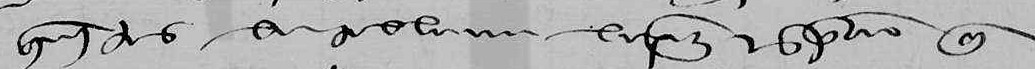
ḡujtes bertollameu lopez esp̄ão q̄
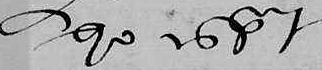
ho esp̄uj
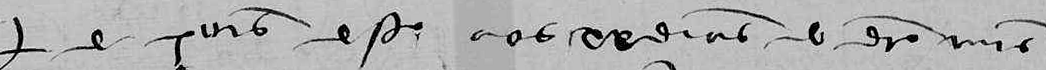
E depois desto aos xx dias do dīo mes
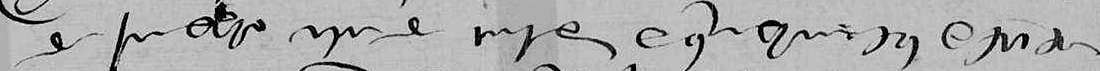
de Julho era de mjl e qinhetꝯ e trīta
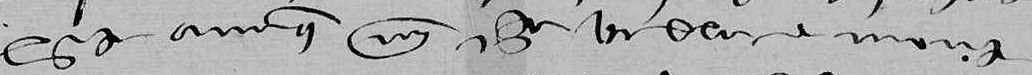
e sete annꝯ em esta villa de monte
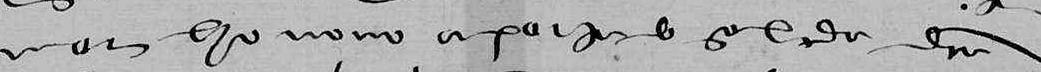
mor ho nouo a porta do sol da dīa
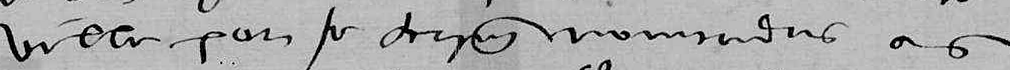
villa por Ja teerem nomeadas as
